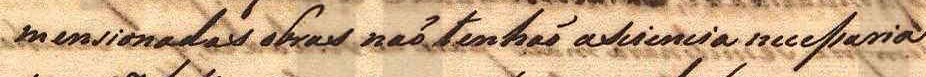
mensionadas obras naõ tenhaõ a sciencia necessaria
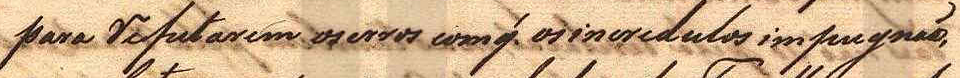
para refutarem os erros com q̄ os incredulos impugnaõ,
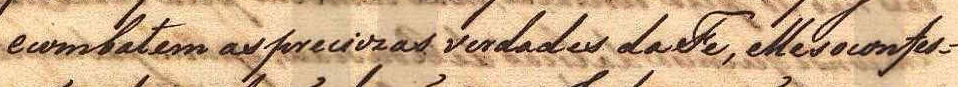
e combatem as preciozas verdades da Fe, elles o confes
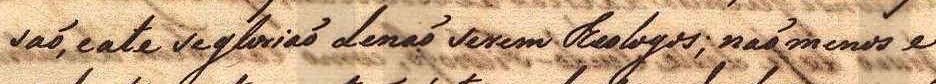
saõ, e ate se gloriaõ de naõ serem Theologos; naõ menos e
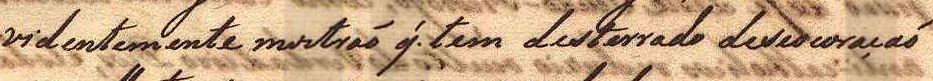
videntemente mostraõ q̄ tem desterrado de seo coraçaõ
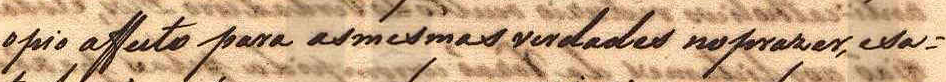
o pio affecto para as mesmas verdades no prazer, e sa
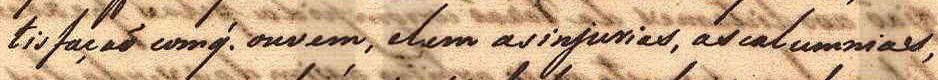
tisfaçaõ com q̄ ouvem, e hem as injurias, as calumnias,
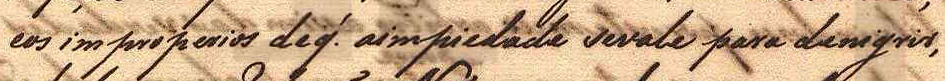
e os improperios de q̄ a impiedade se vale para denigrir,
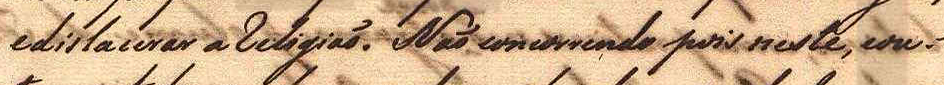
e dislacerar a Religiaõ. Naõ concorrendo pois neste, e ou
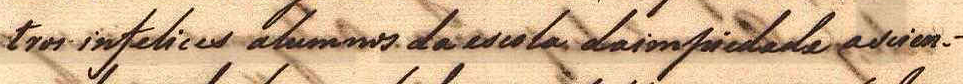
tros infelices alumnos da escola da impiedade a scien
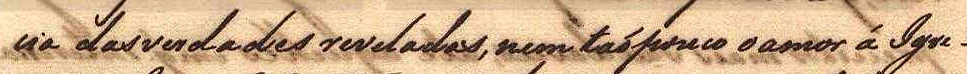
cia das verdades reveladas, nem taõpouco o amor á Igre
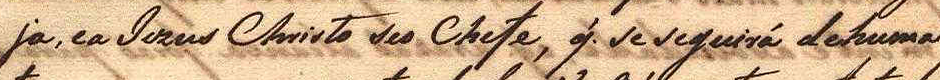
ja, e a Iezus Christo seo Chefe, q̄ se seguirá de huma
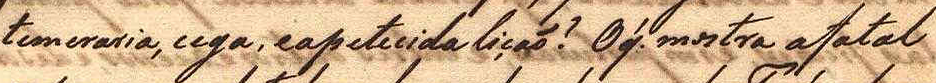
temeraria, cega, e apetecida liçaõ? O q̄ mostra a fatal
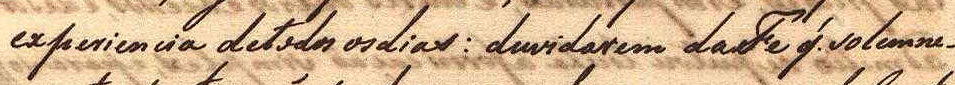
experiencia de todos os dias: duvidarem da Fé q̄ solemne
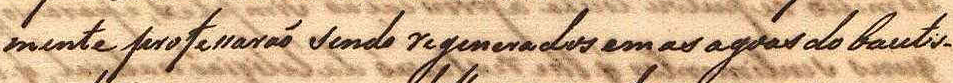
mente professaraõ sendo regenerados em as agoas do bautis
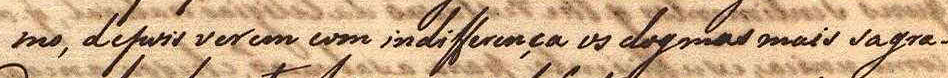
mo, depois verem com indifferença os dogmas mais sagra
